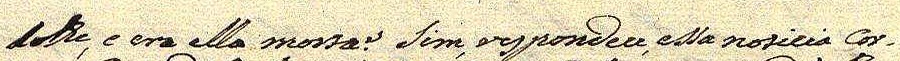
dolhe, e era ella morta: sim, respondeu, essa noticia cor
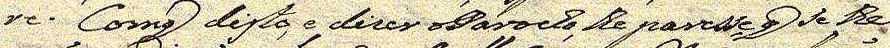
re. Com q̄ disto, e dizer o Parocho lhe paresse q̄ se lhe
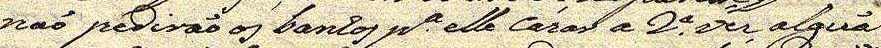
naõ pediraõ os banhos p.a elle cazar a 2.a vez, alguā
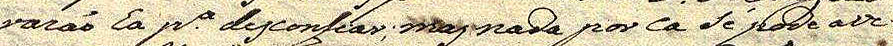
razaõ há p.a desconfiar; mas nada por ca se pode ave
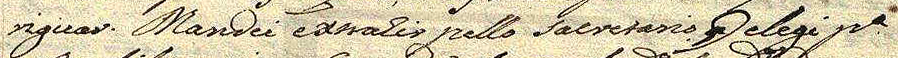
riguar. Mandei extrahir pello Sacretario q̄ elegi p.a
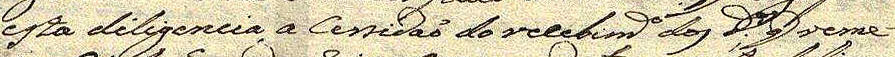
esta diligencia a certidaõ do recebim.to dos D.os q̄ reme
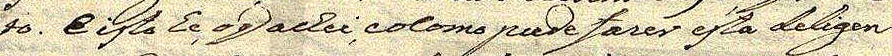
to. E isto he, o q̄ achei e o como pude fazer esta deligen
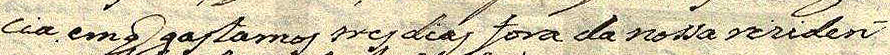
cia em q̄ gastamos tres dias fora da nossa reziden
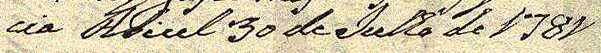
cia Abiul 30 de Iulho de 1781
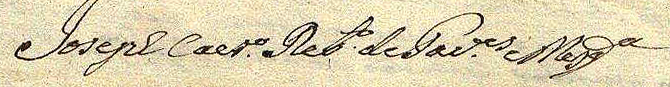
Ioseph Caet.o Reb.o de Tav.es e Mesq.a
